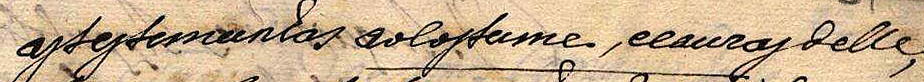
as testemunhas ao costume, e cauzas delle,
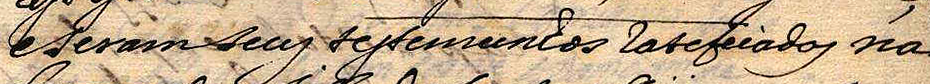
e seram seus testemunhos Rateficados na
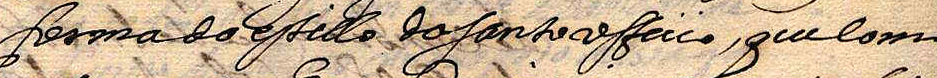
forma do estillo do santo officio, que com
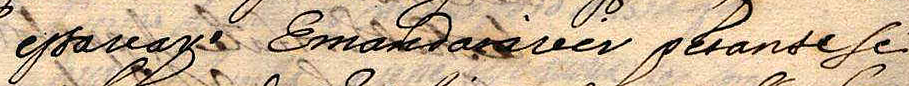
esta vay. E mandara vir perante si
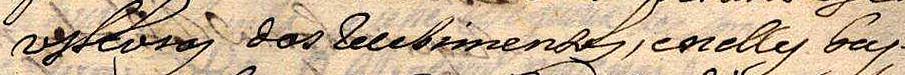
os livros dos Recebimentos, e nelles bus
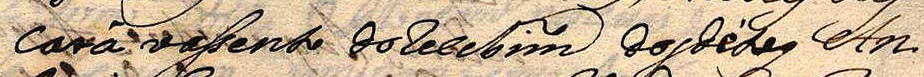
cará o assento do Recebimto dos ditos An
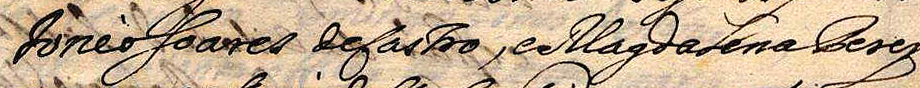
tonio soares de Castro, e MagdaLena Perey
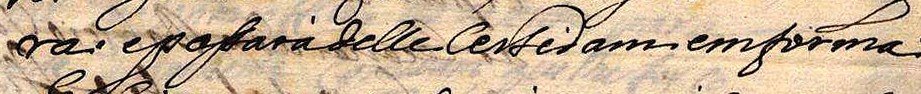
ra; e passará delle certidam em forma
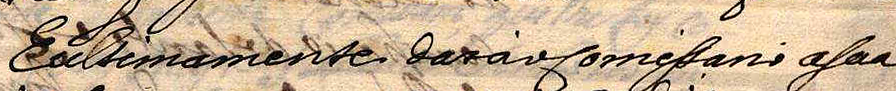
E ultimamente dará ao Comissario a sua
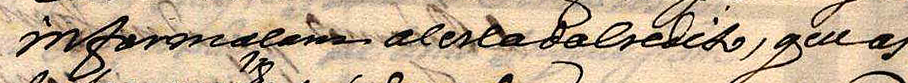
informaçam acerca do credito, que as
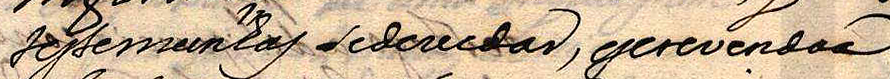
testemunhas se deue dar, escrevendoa
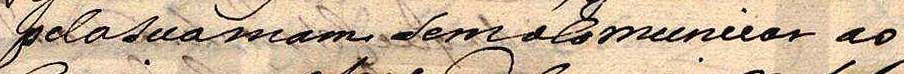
pela sua mam sem o comunicar ao
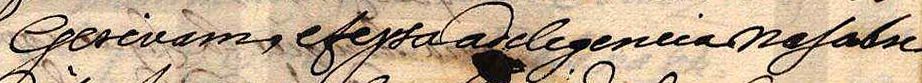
escrivam, e feyta a deligencia na sobre
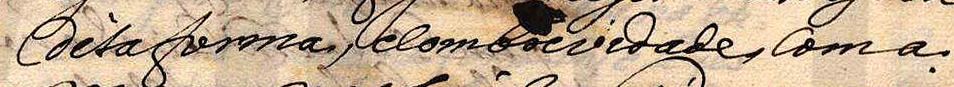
dita forma, e com brevidade, com a
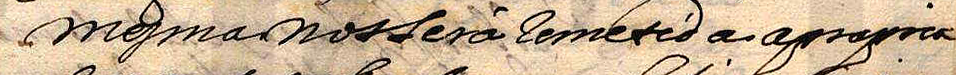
mesma nos será Remetida a propria
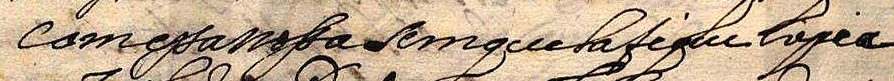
com esta nossa sem que la fique copia
